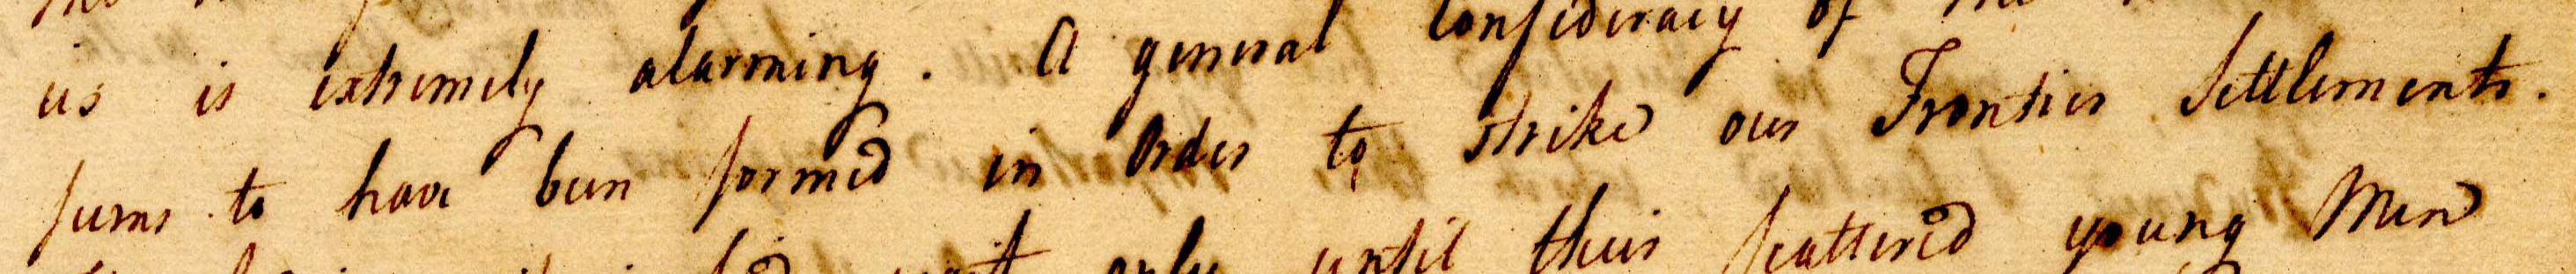turns to have been formed in order to strike our Frontier Settlements.
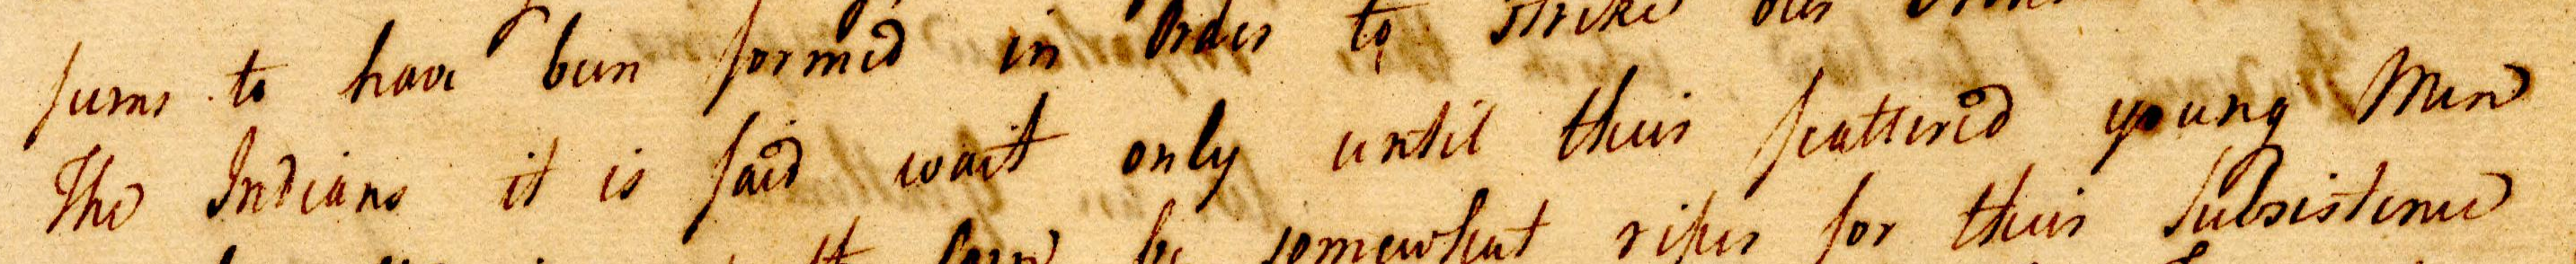The Indians it is said wait only until their feattered young Men
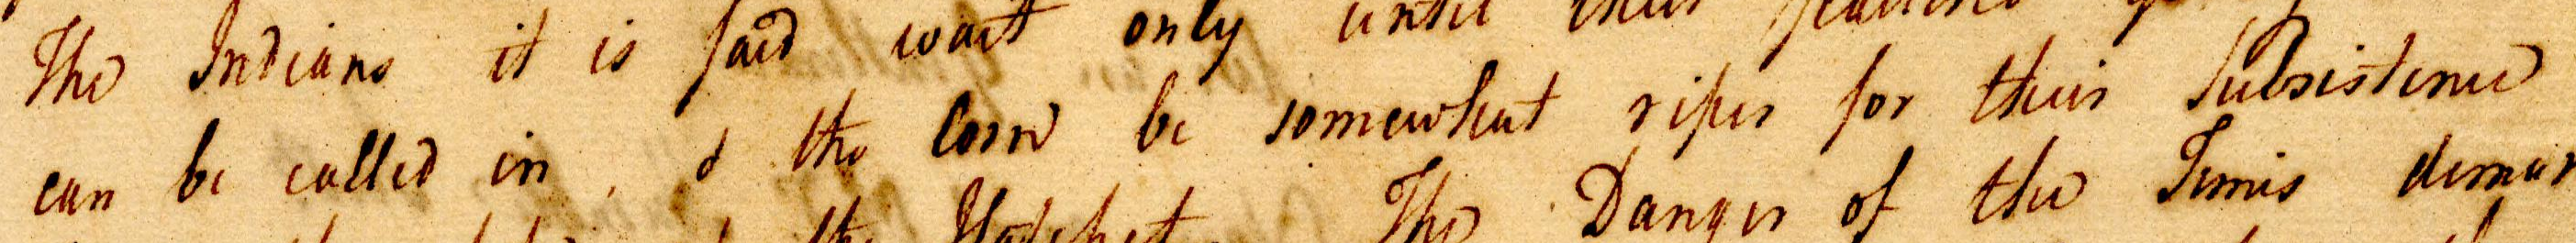can be called in & the corn be somewhat riper for their Subsistence
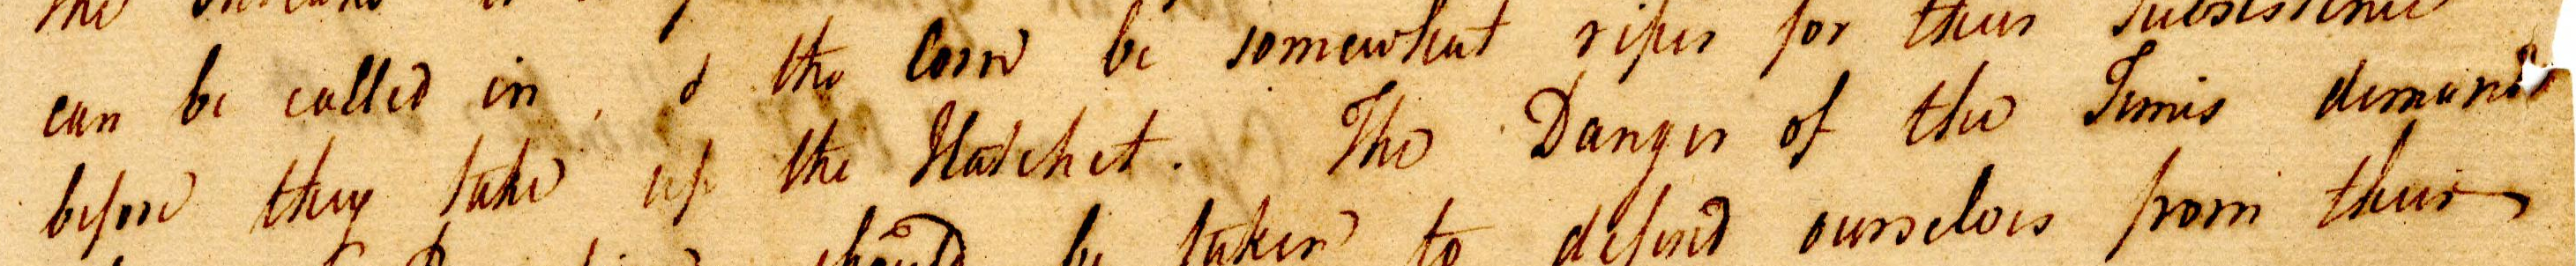before they take up the Hatchet. The Danger of the Times demand
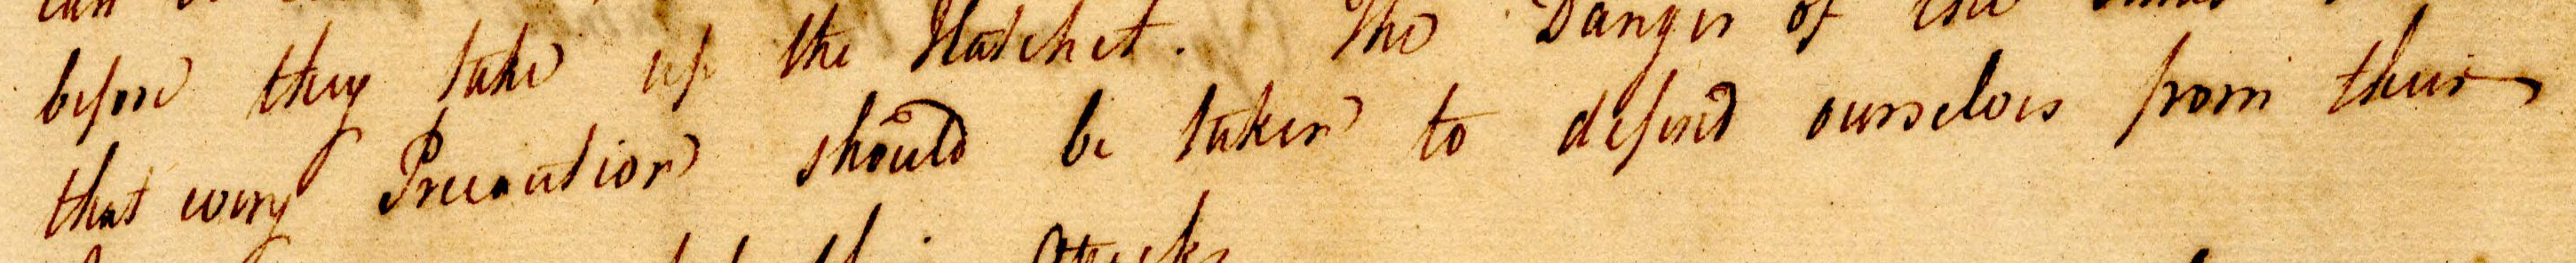that every Precaution should be taken to defend ourselves from their
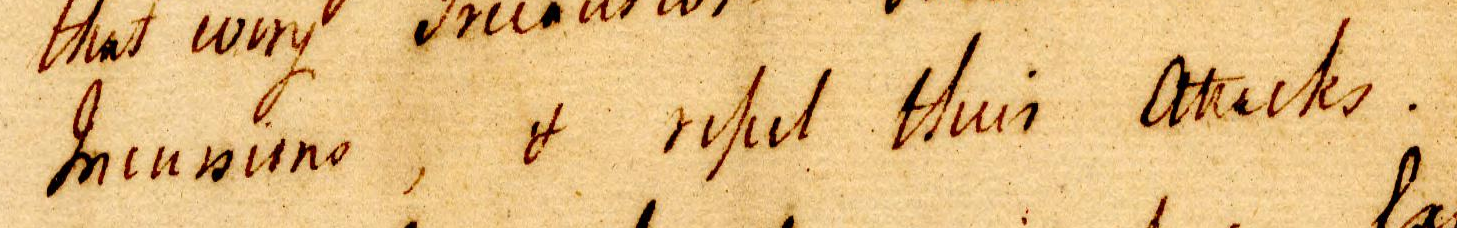Incursions, & repel their Attacks.
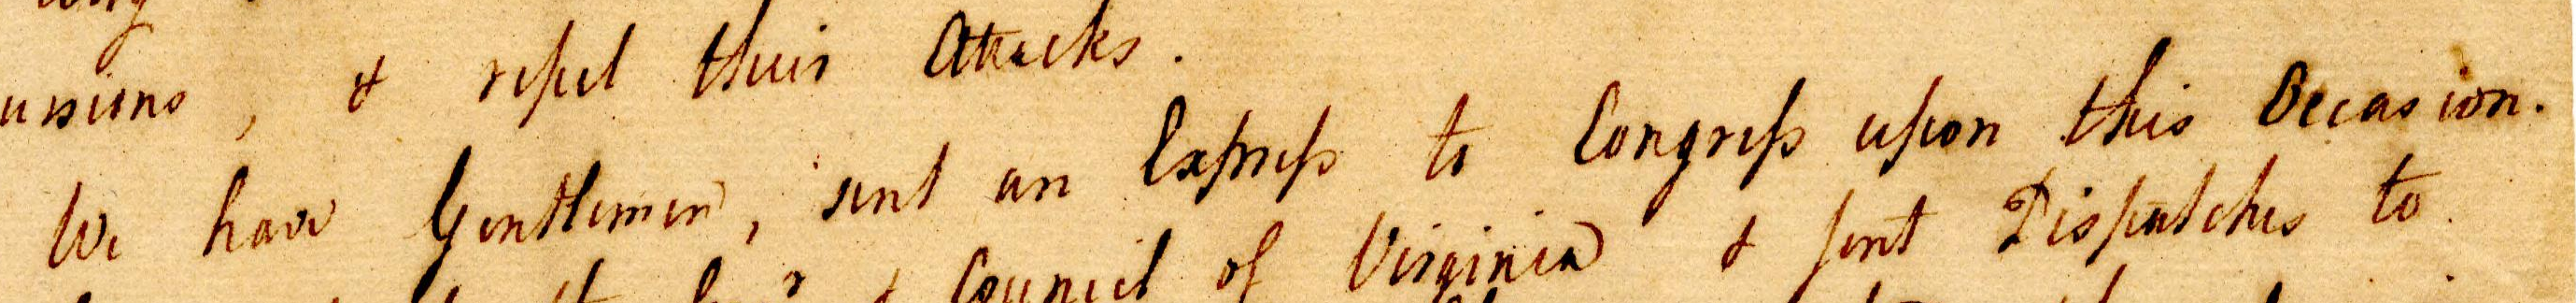We have Gentlemen, sent an Express to Congress upon this Occasion.
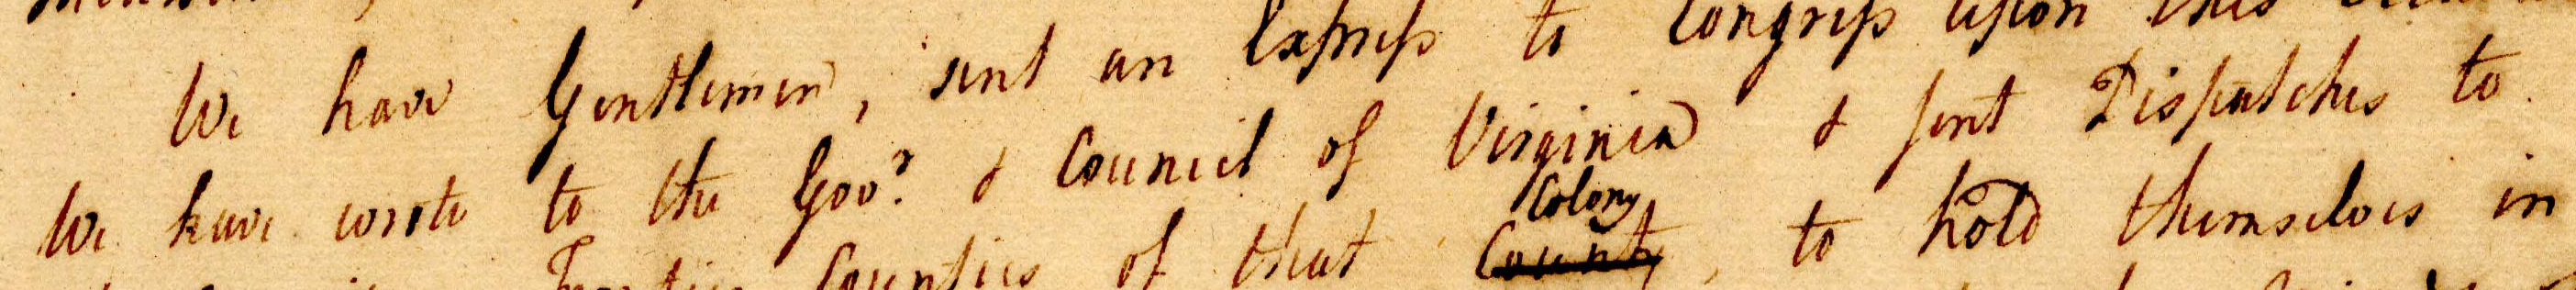We have wrote to the Gov^r. & Council of Virginia & sent Dispatches to
